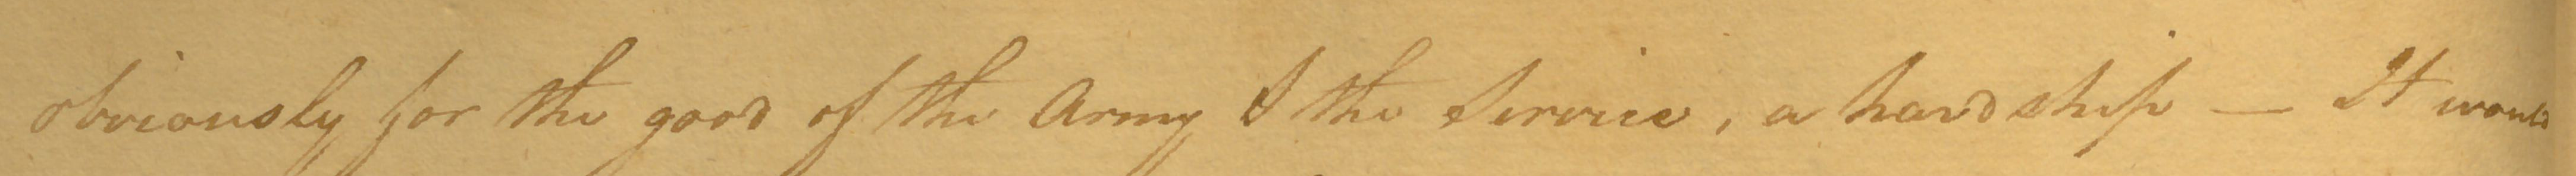obviously for the good of the Army & the Service, a hardship- It would
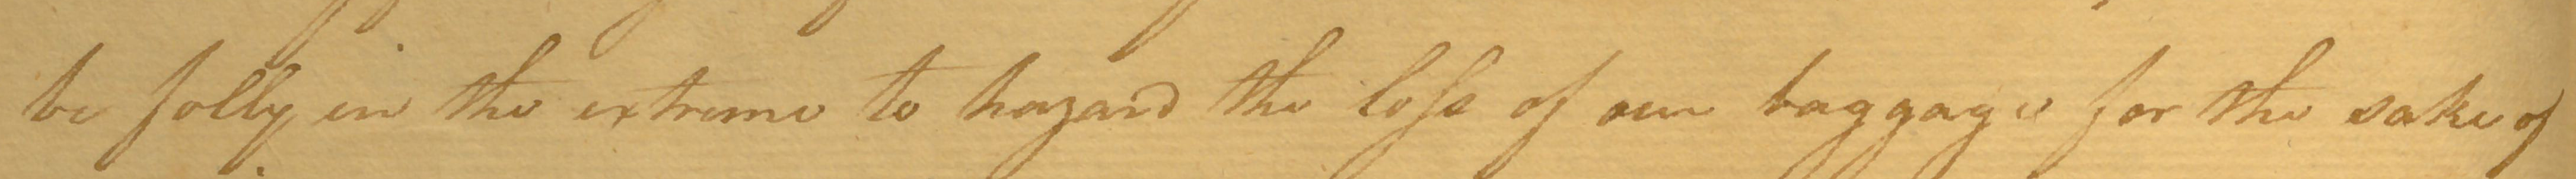be folly in the extreme to hazard the loss of our baggage for the sake of
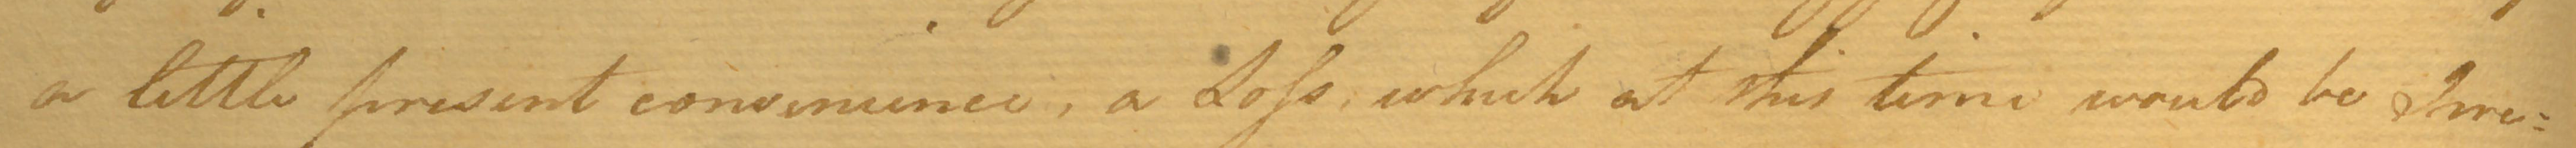a little present convenience, a Loss which at this time would be Irre-
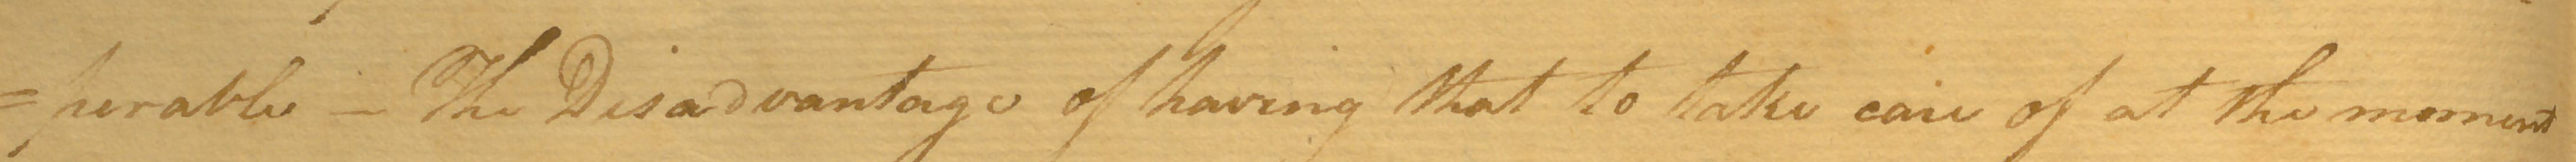-perable- The Disadvantage of having that to take care of at the moment
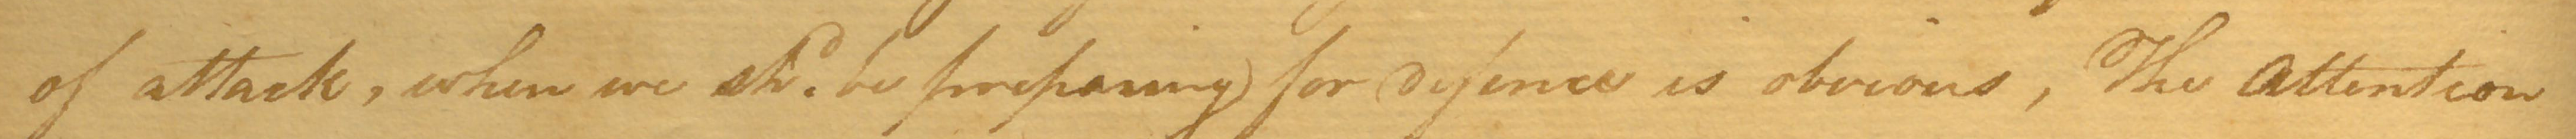of attack, when we sh^d. be preparing for defence is obvious, The Attention
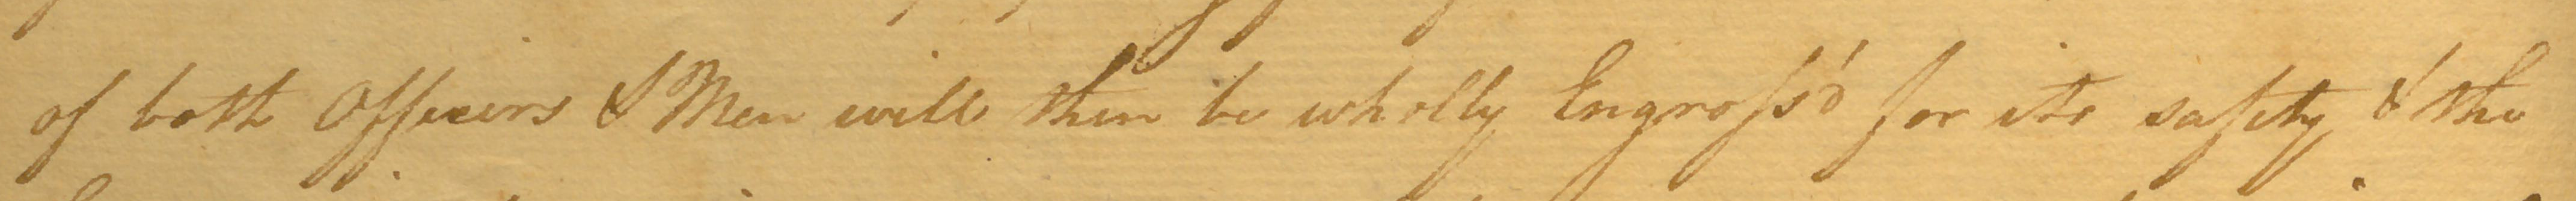of both Officers & Men will then be wholly Engross'd for its safety & the
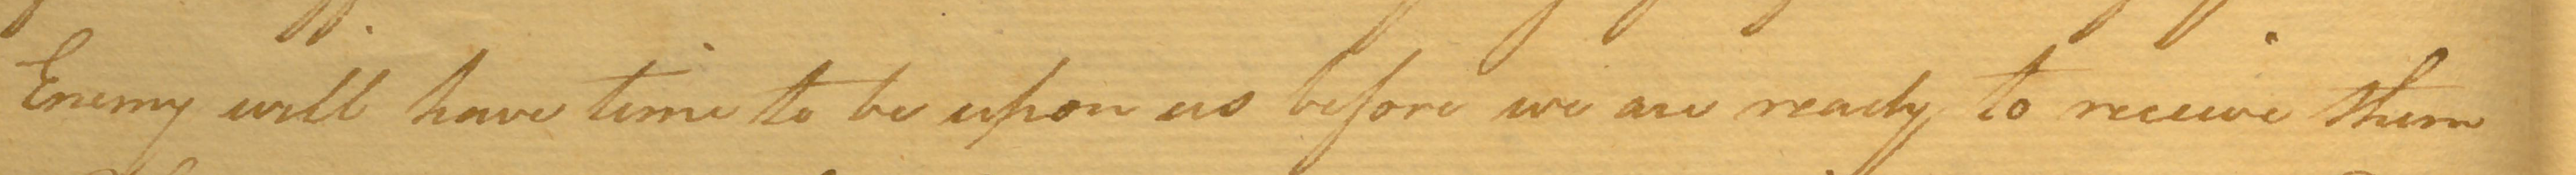Enemy will have time to be upon us before we are ready to receive them
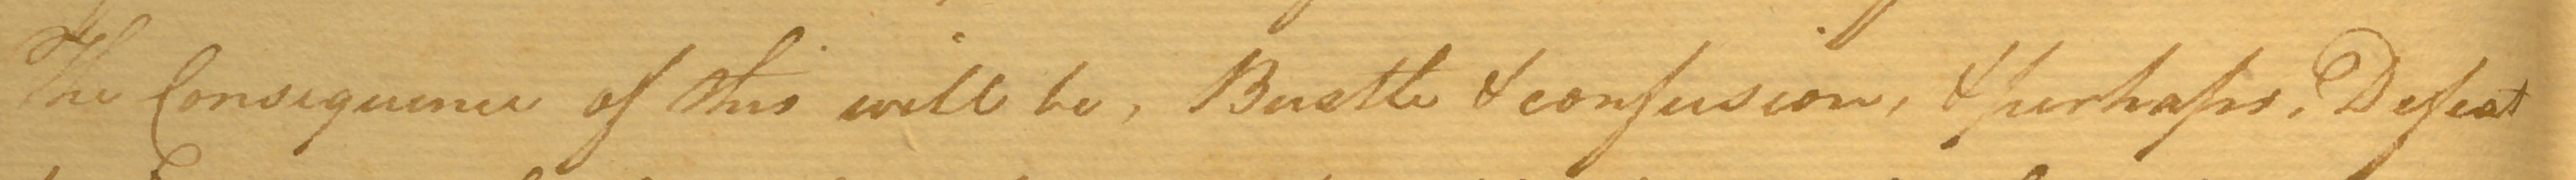The Consequence of this will be, Bustle & confusion, & perhaps, Defeat
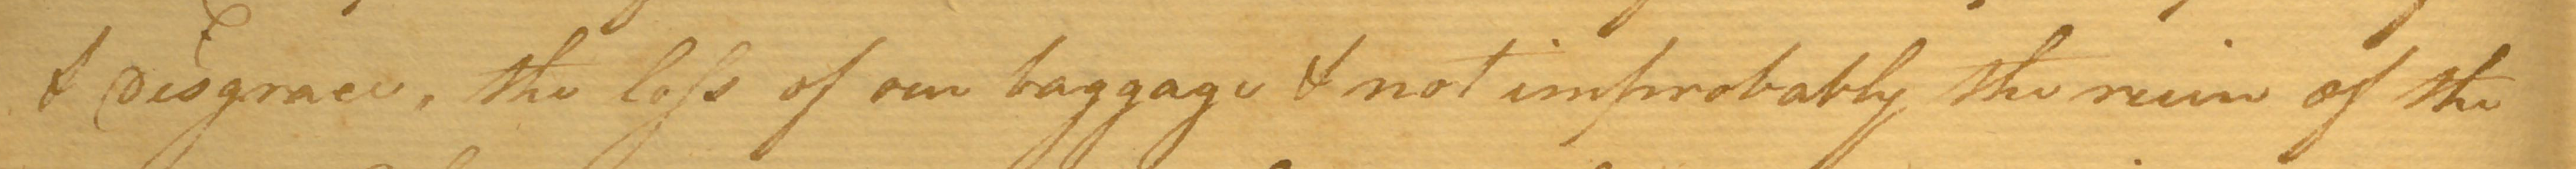& disgrace, the loss of our baggage & not improbably the ruin of the
